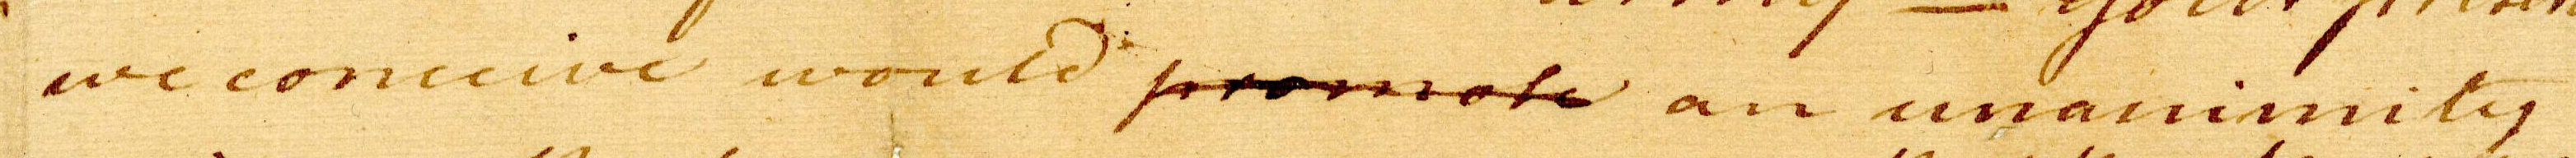we conceive would [promote] an unanimity
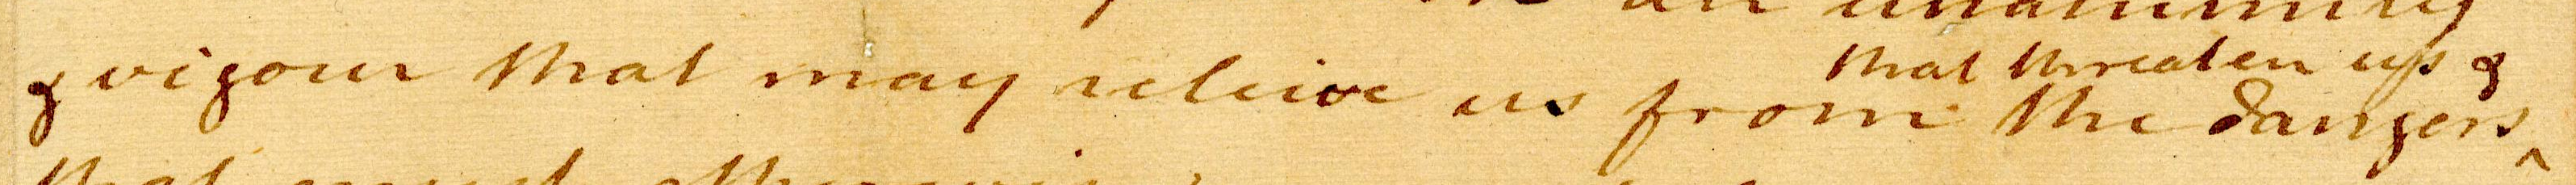& vigour that may releive us from the dangers ^
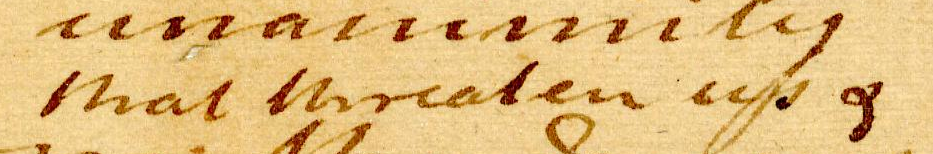that threaten us &
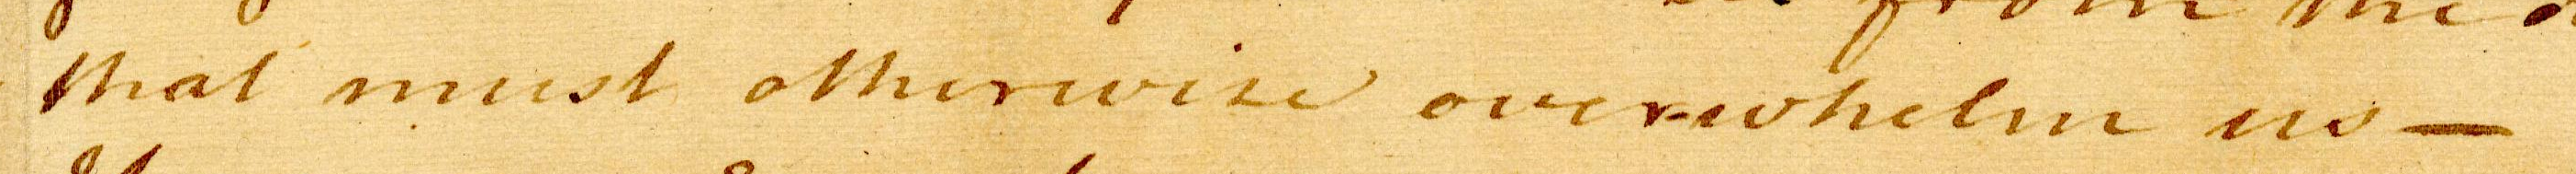that must otherwize overwhelm us-
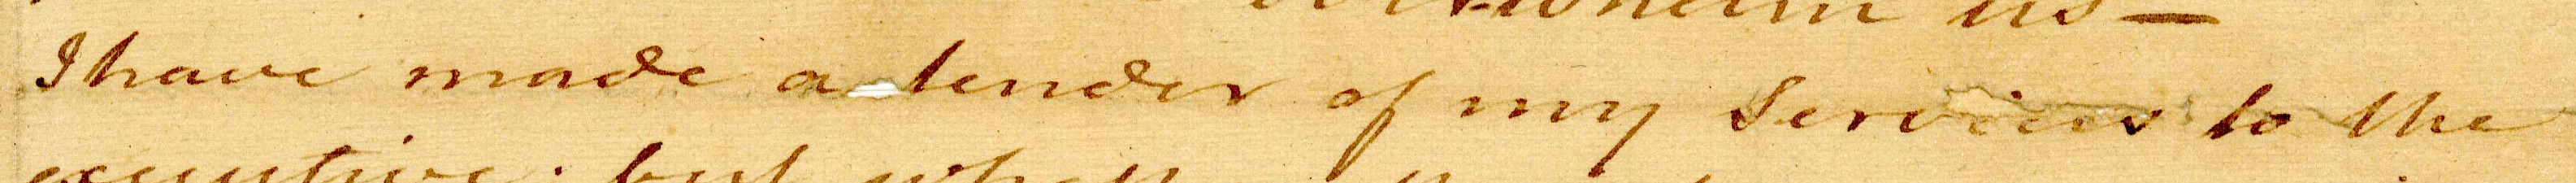I have made a tender of my services to the
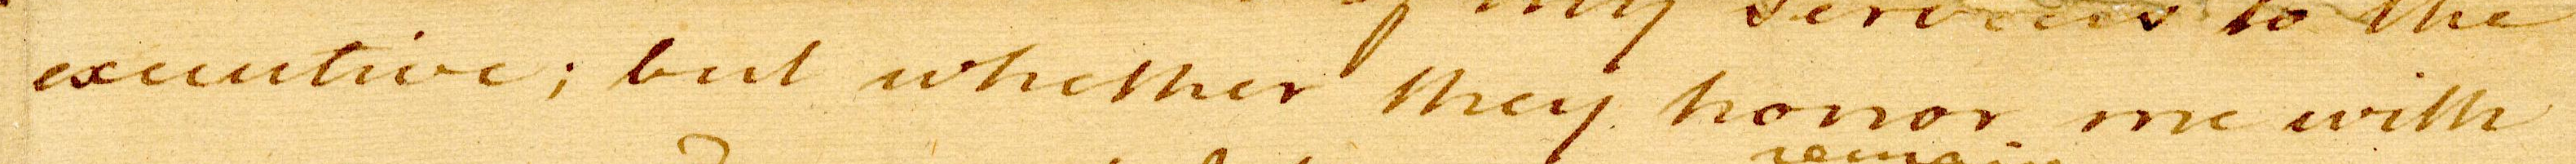executive; but whether they honor me with
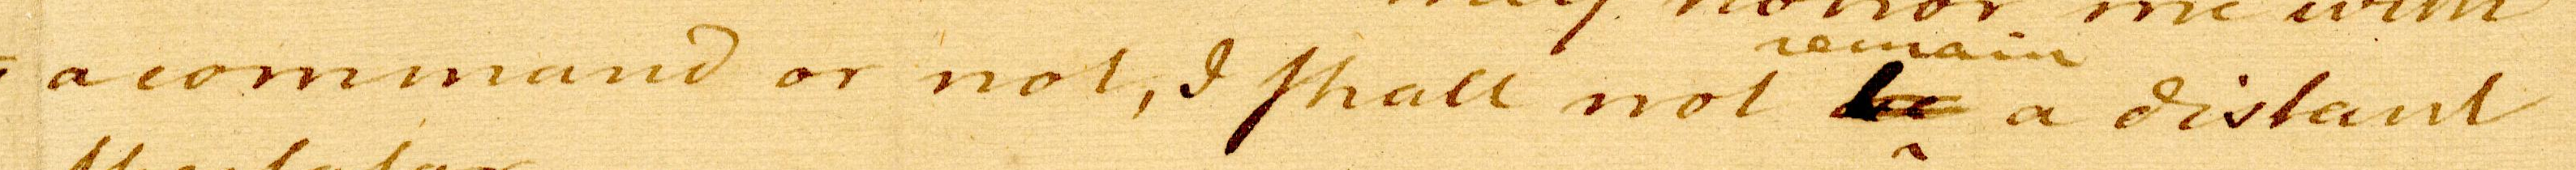a command or not, I shall not [be] ^ a distant
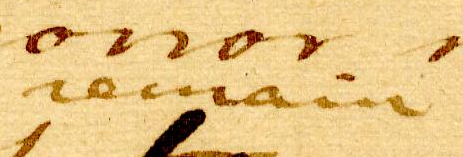remain
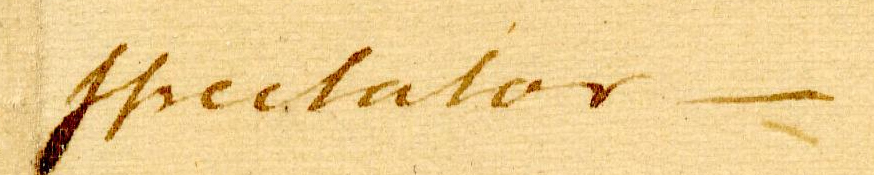spectator-
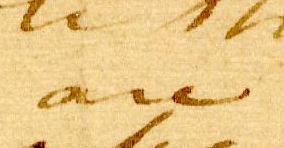are
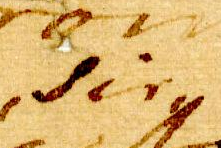Sir
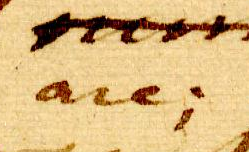are;
